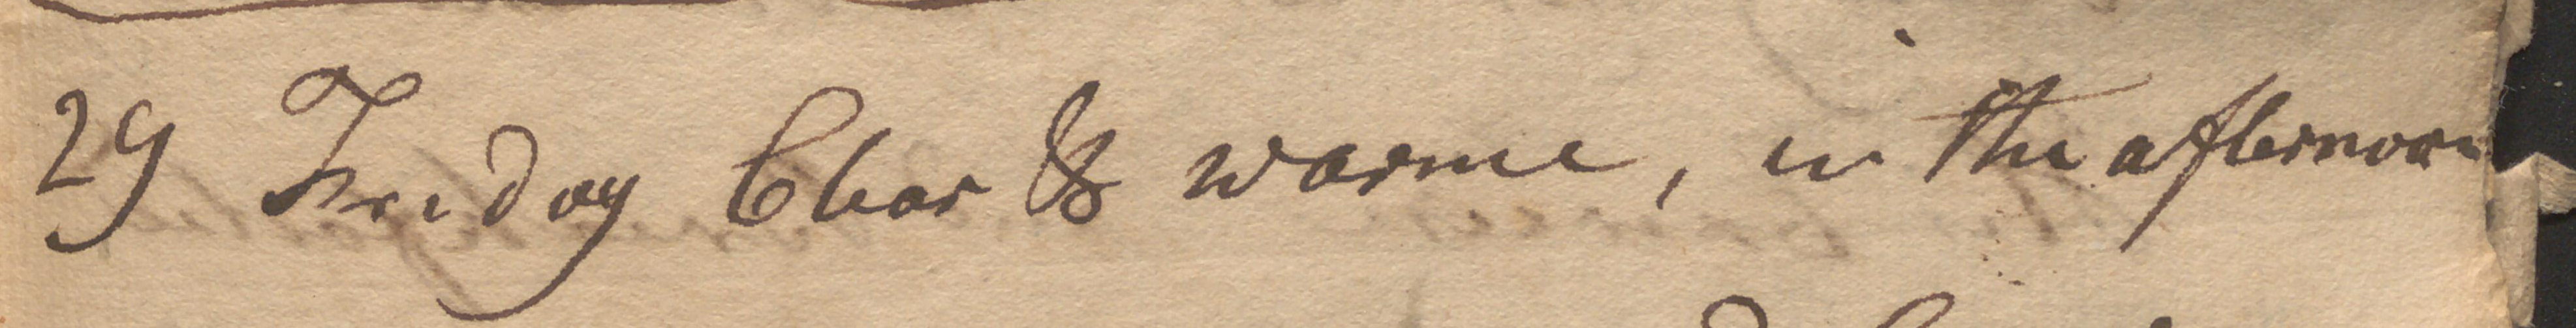29 Friday Clear & warme, in the afternoon
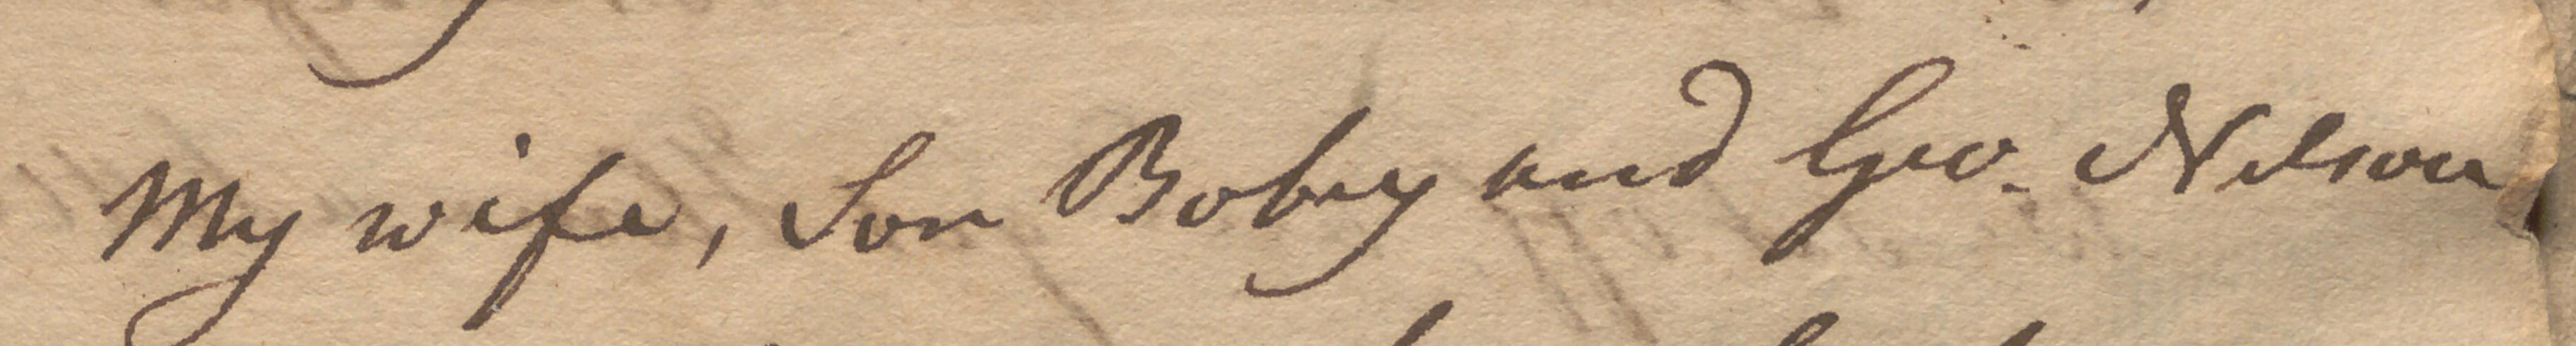my wife, Son Bobey and Geo. Nelson
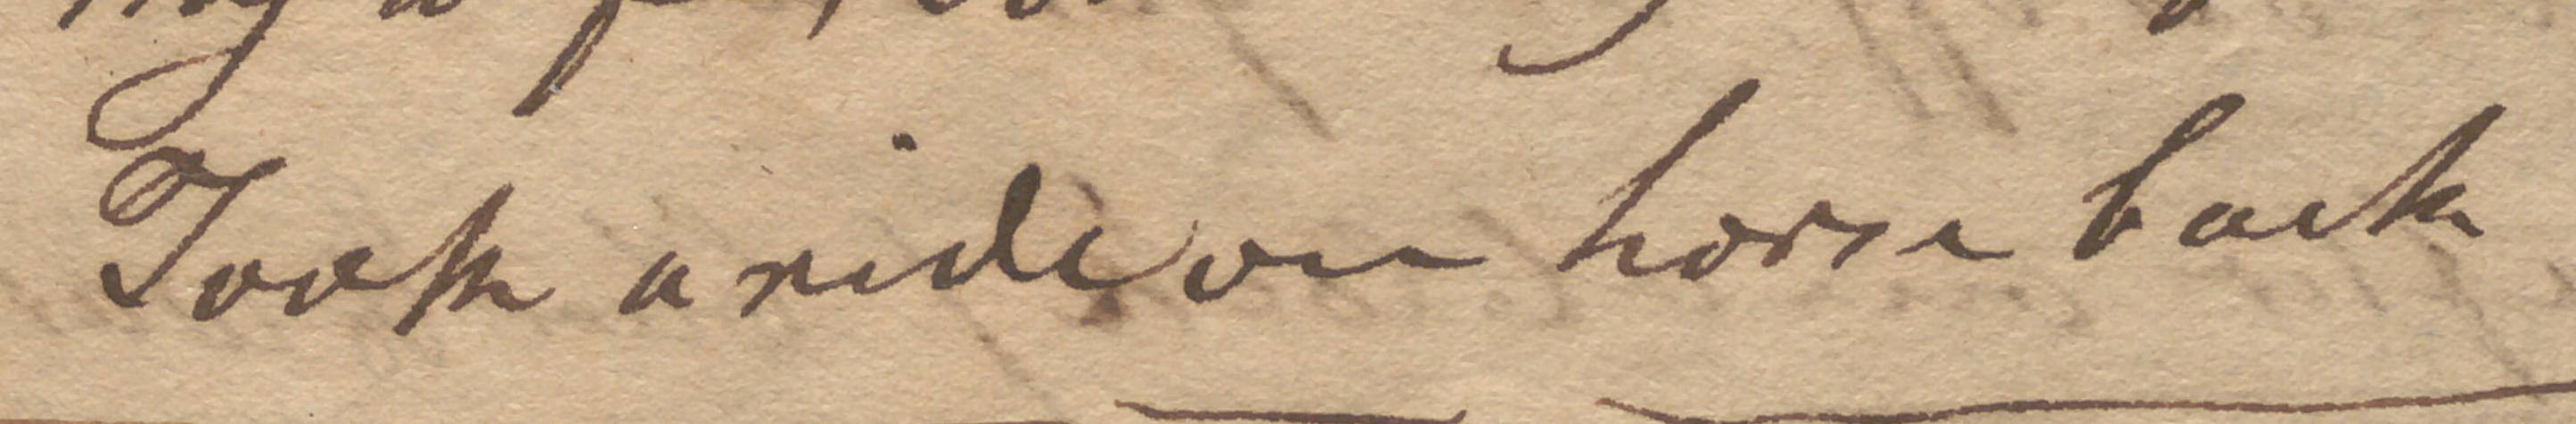Took a ride on horse back
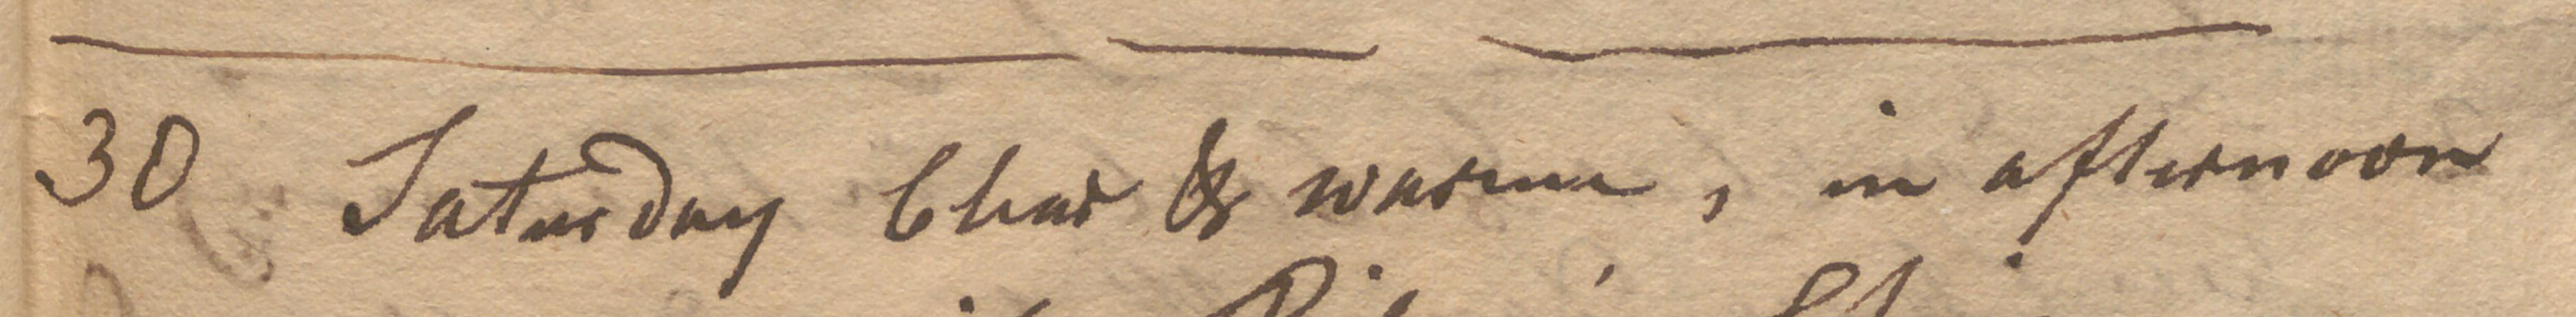30 Saturday Clear & warme, on afternoon
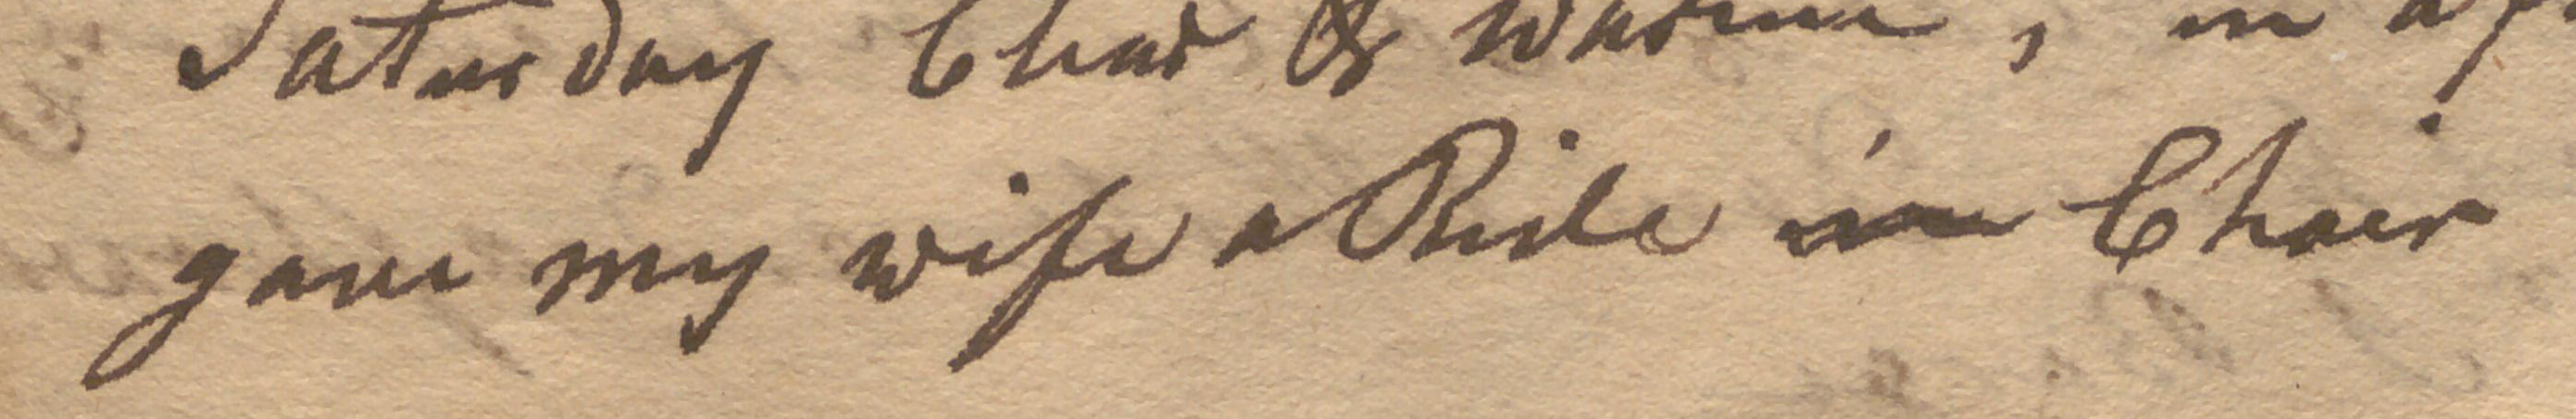gave my wife a Ride [in] Chair
